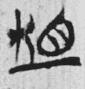相
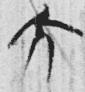大（太）
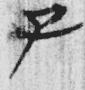子
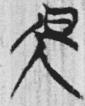昃
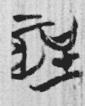聖（聽）
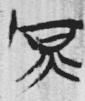庶
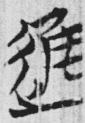進
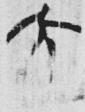大（太）
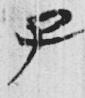子
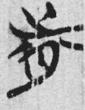前
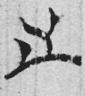之
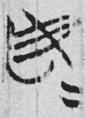母
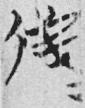俤俤
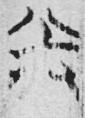灷（遜）
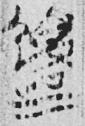退
